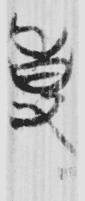事
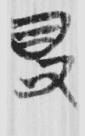𠭁
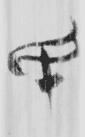民
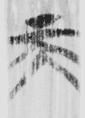天
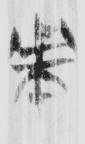央
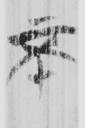不
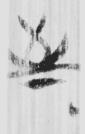至
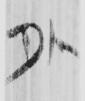外
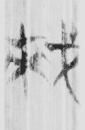{戈戈}
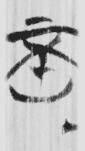否
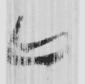㠯（以）
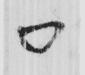厶
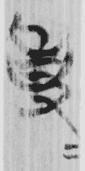事=
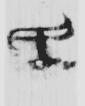民
